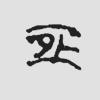恆
